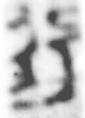坪（平）
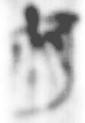夜
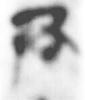君
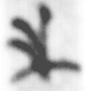之
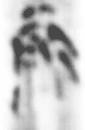兩
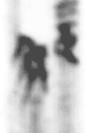駟
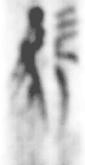○（牝）
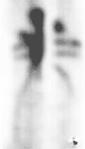朱
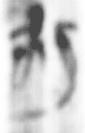夜
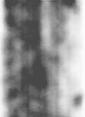君
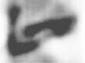㠯（以）
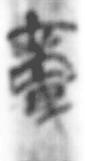𨍱（乘）
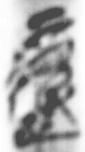○（復）
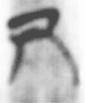尹
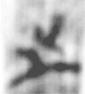之
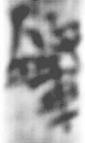○（畋）
